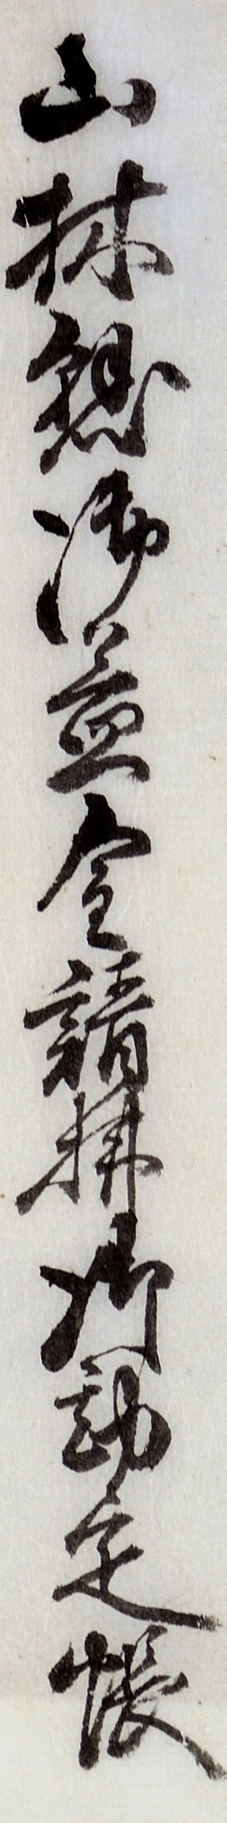山林懸御益金諸払御勘定帳
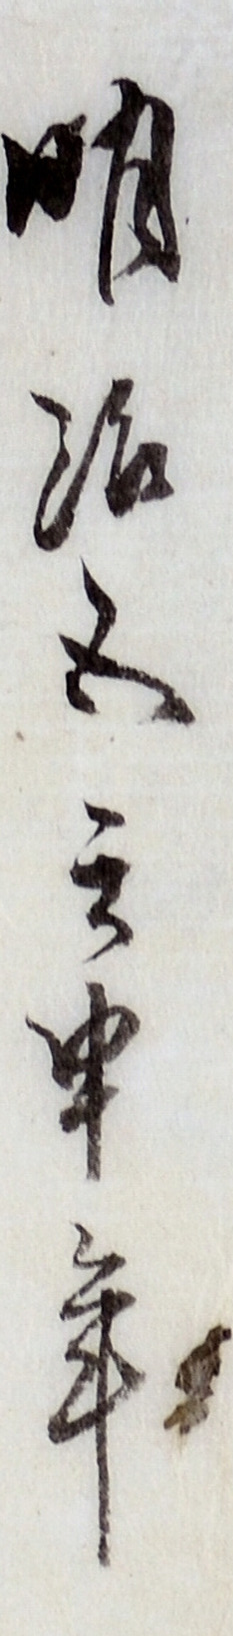明治五壬申年

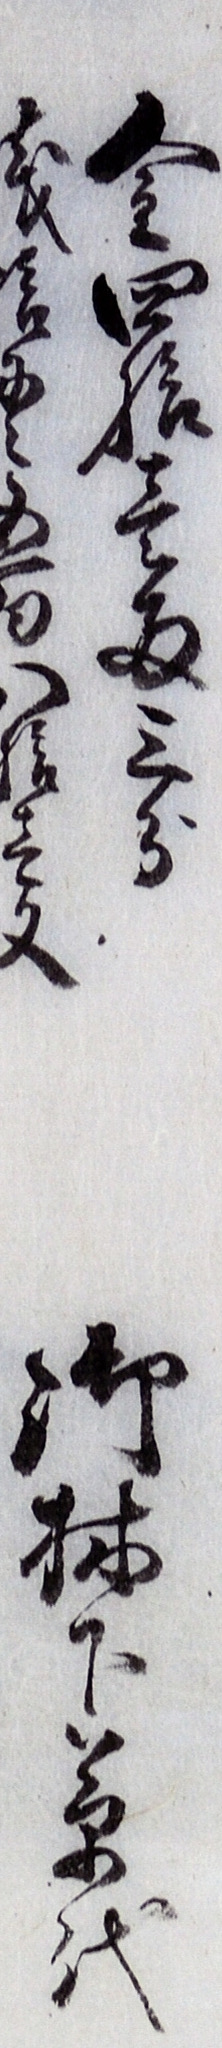一金四拾壱両三分御林下草代
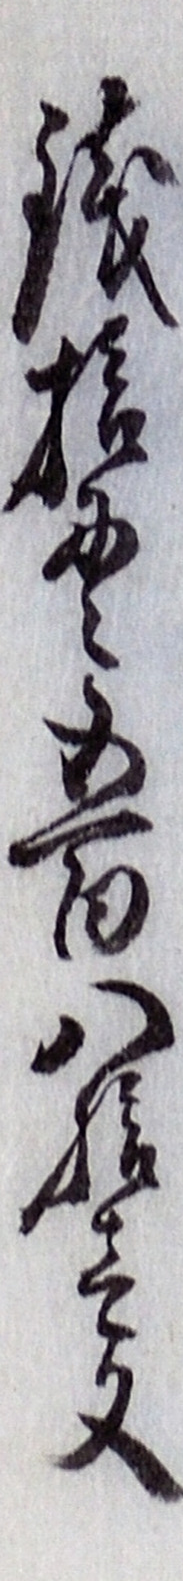銭拾貫五百八拾壱文
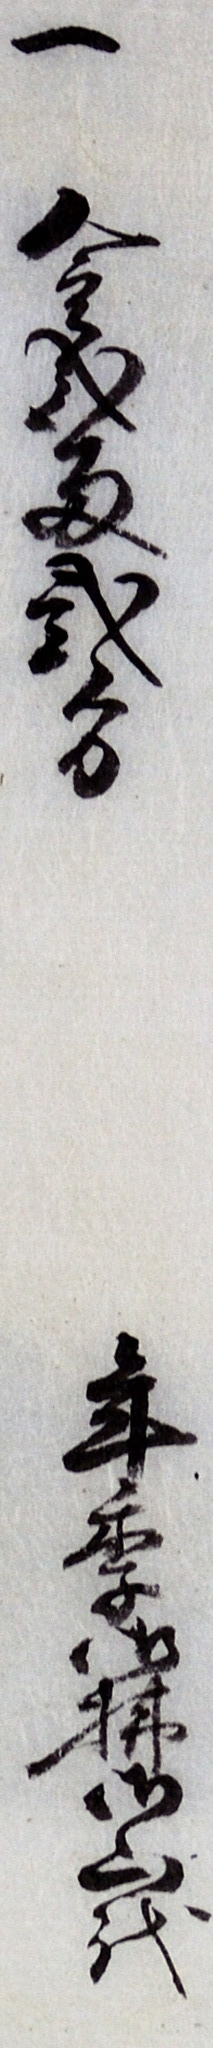一金弐両弐分年季御払御山代
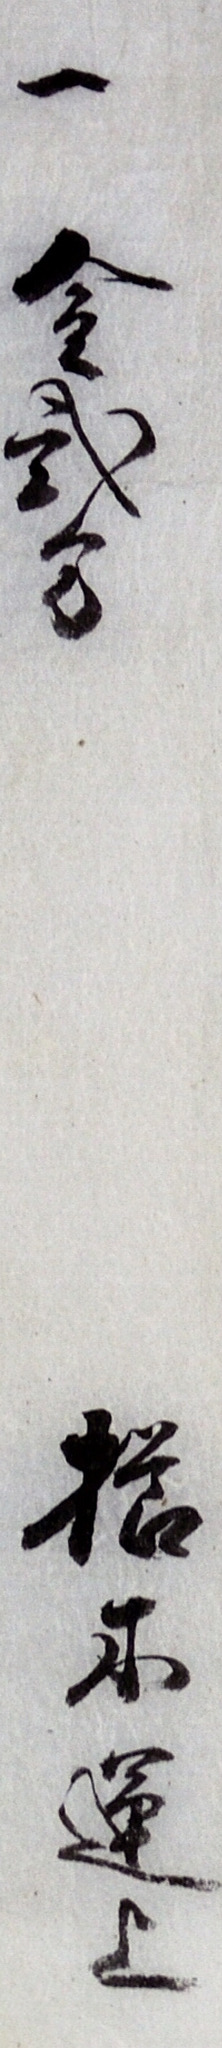一金弐分櫛木運上
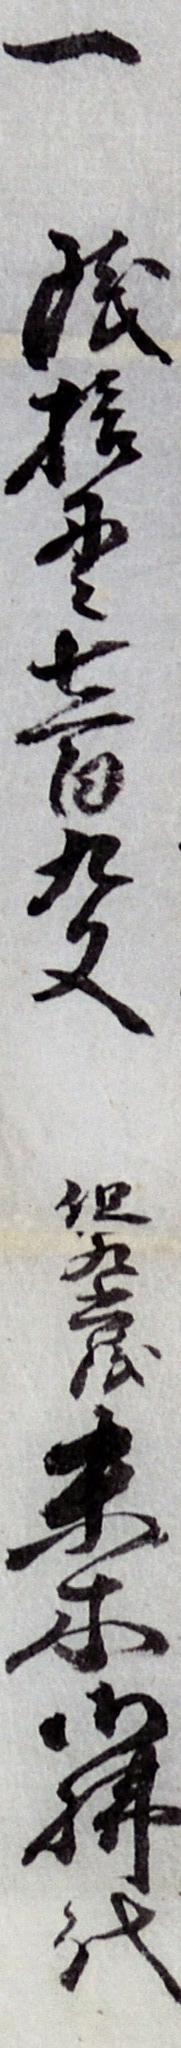一銭拾貫七百九文但九六銭末木御払代
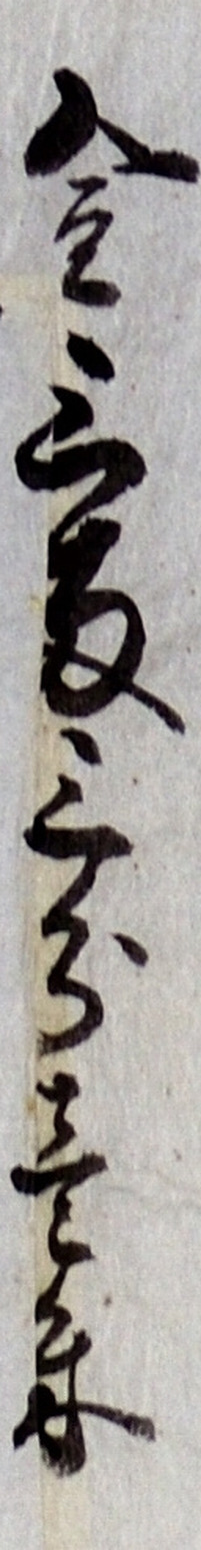金三両三分壱朱
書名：山林懸御益金請拂御勘定帳
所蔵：伊那市立高遠町図書館・合同会社AMANE
